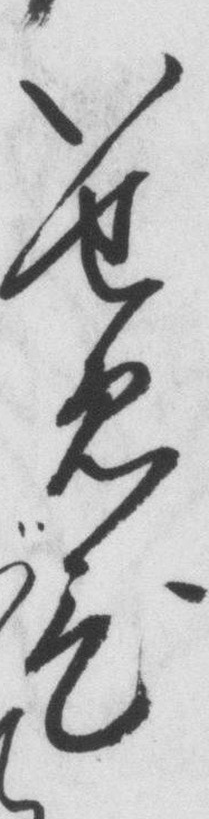いせゑひ
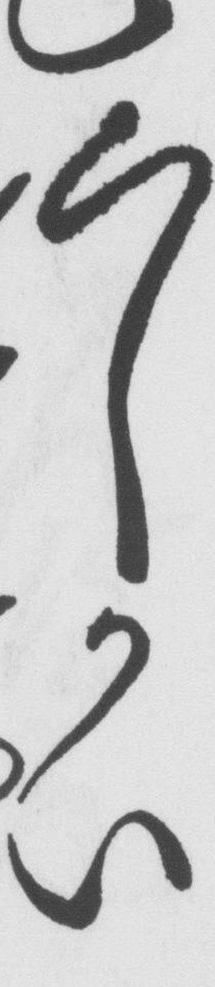鴨くしかい
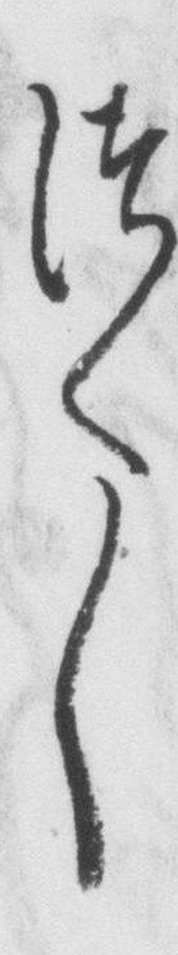つくし
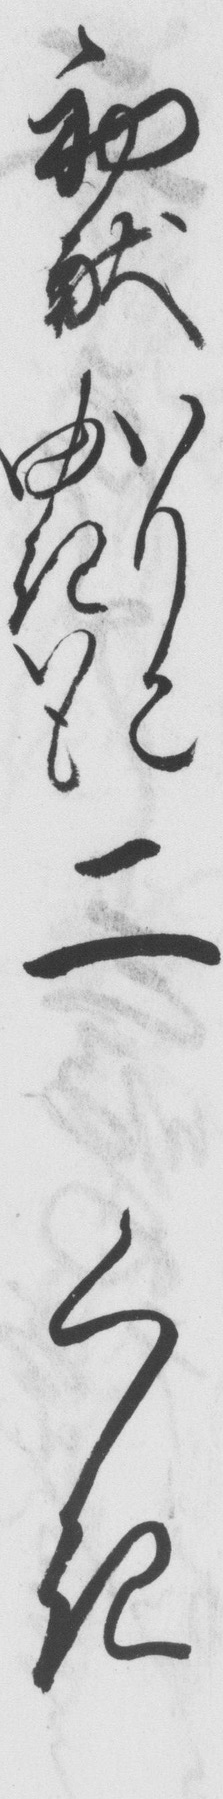初献いりこ二くき
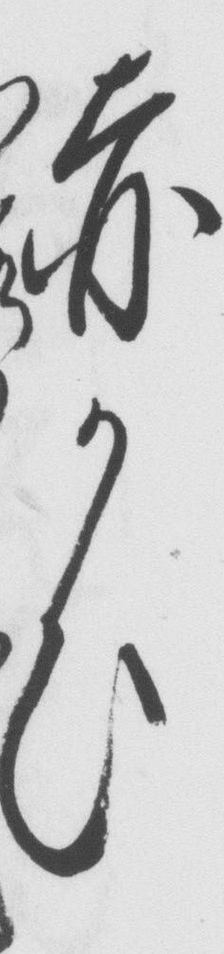赤かひ
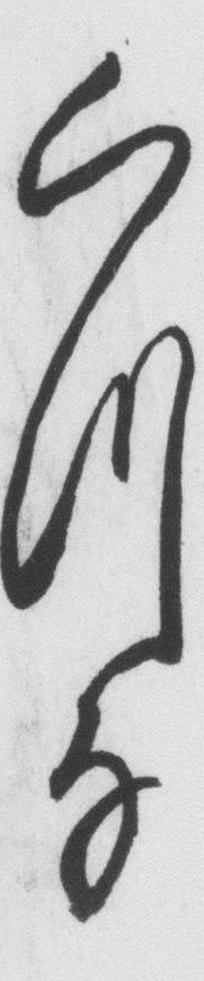くつな
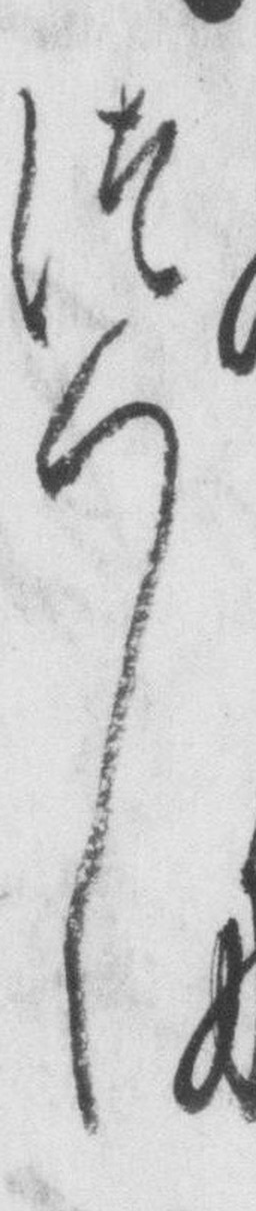つくし

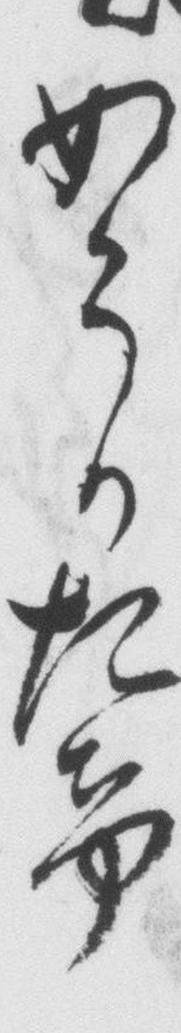めうかたけ
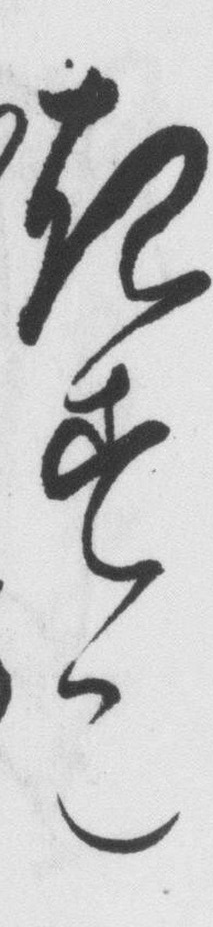きすこ
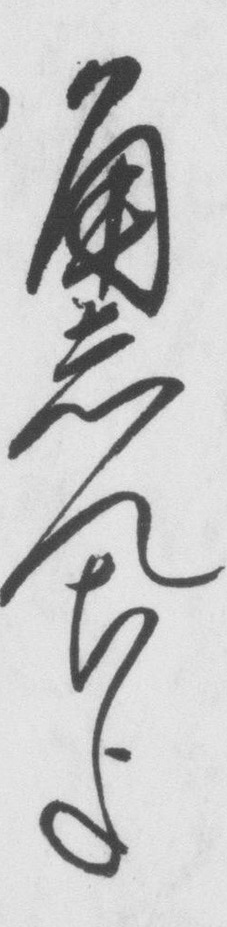角しんちよ

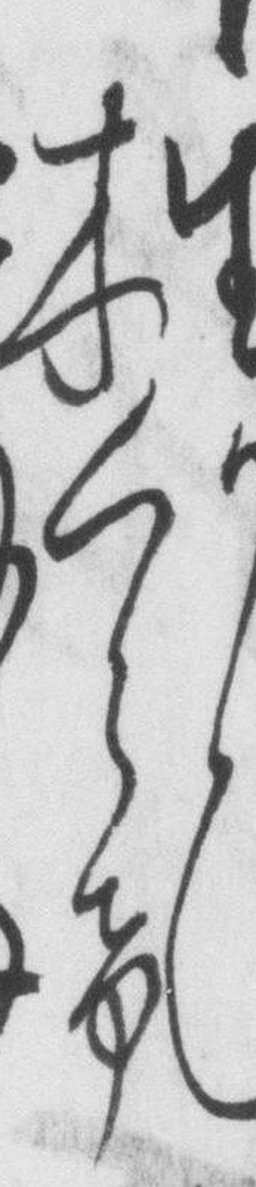木くらけ
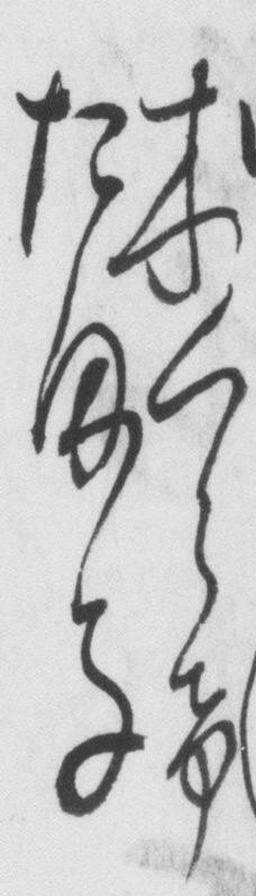たま子
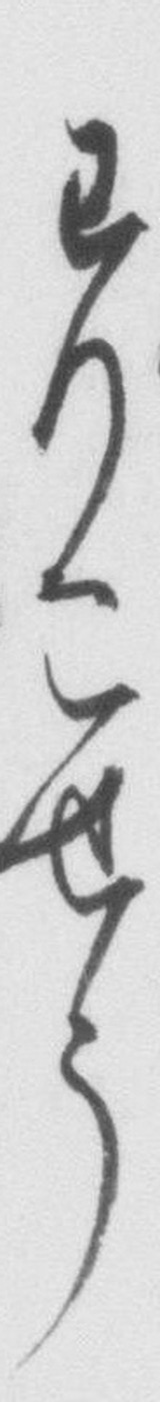わりこせう
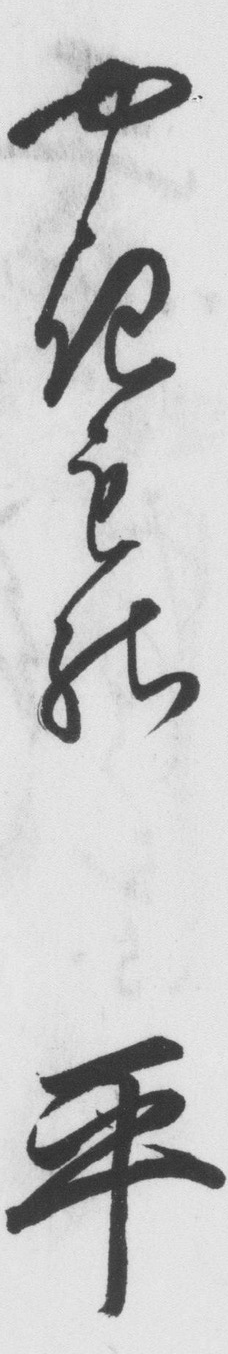やきもの平
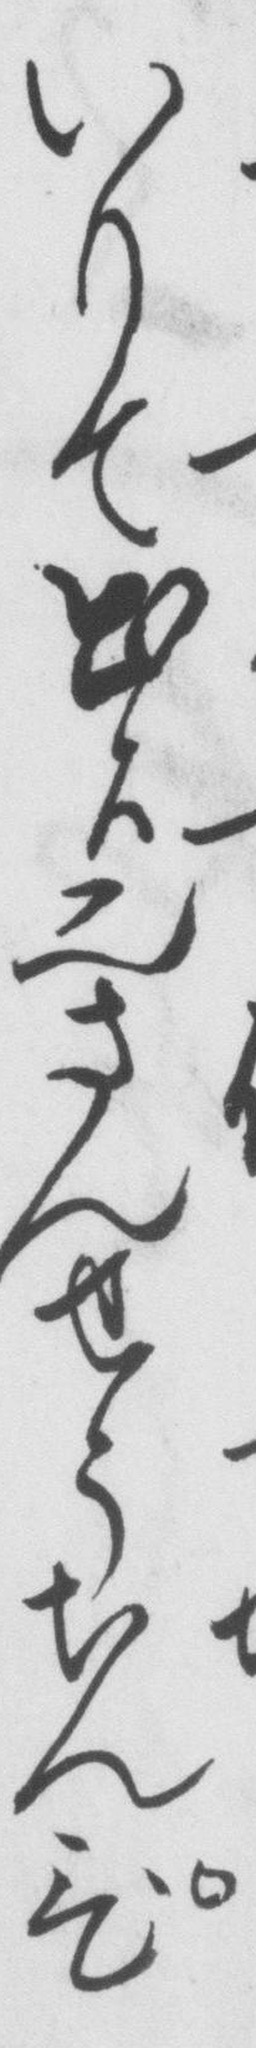いりて也さんせうちんひ
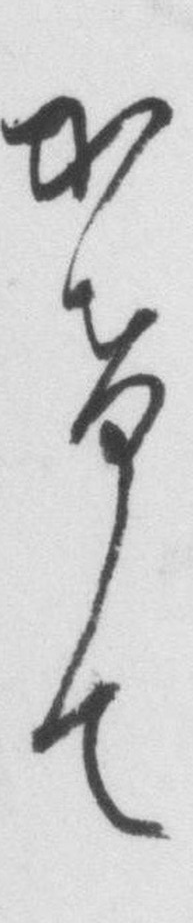かけて
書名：料理筌
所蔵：大阪府立大学学術情報センター 国文学研究資料館
